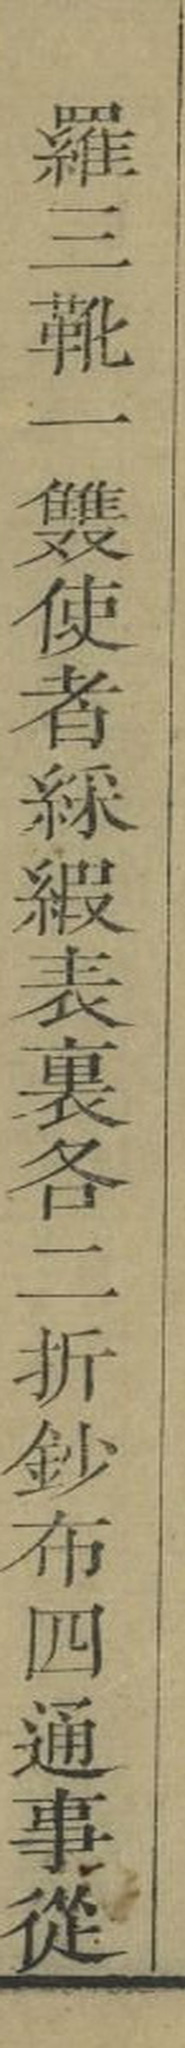羅三靴一双使者綵緞表裏各二折鈔布四通事従
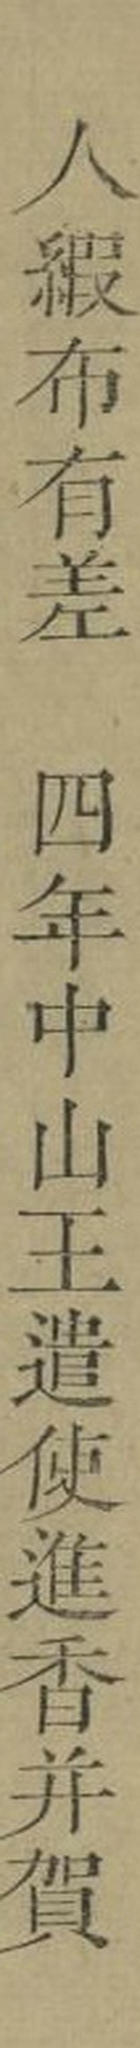人緞布有差四年中山王遣使進香幷賀
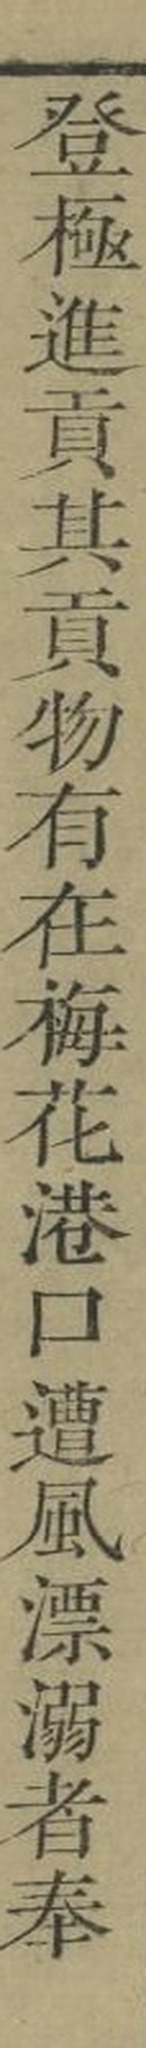登極進貢其貢物有在梅花港口遭風漂溺者奉
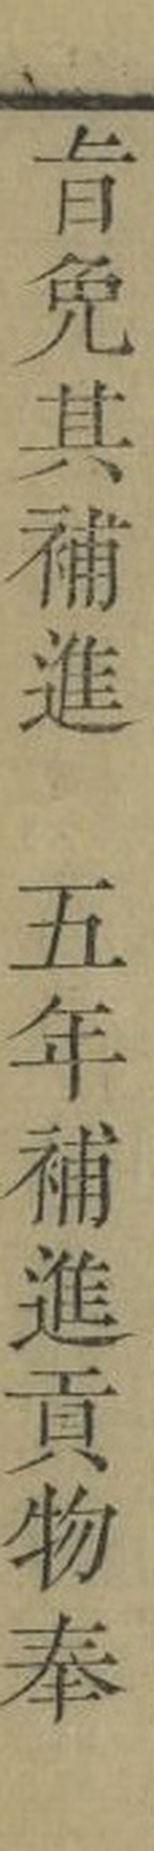旨免其補進五年補進貢物奉

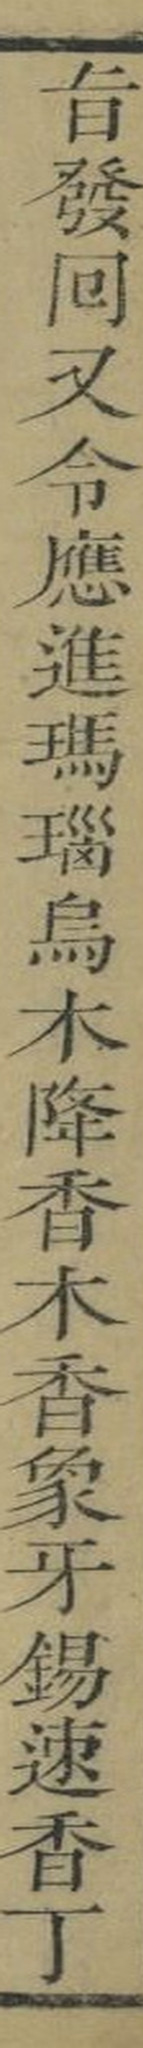旨発回又令応進瑪瑙烏木降香木香象牙錫速香丁
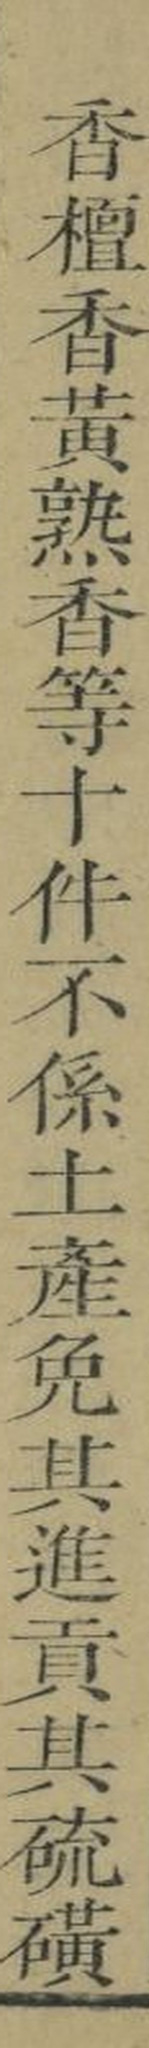香檀香黄熟香等十件不係土産免其進貢其硫磺
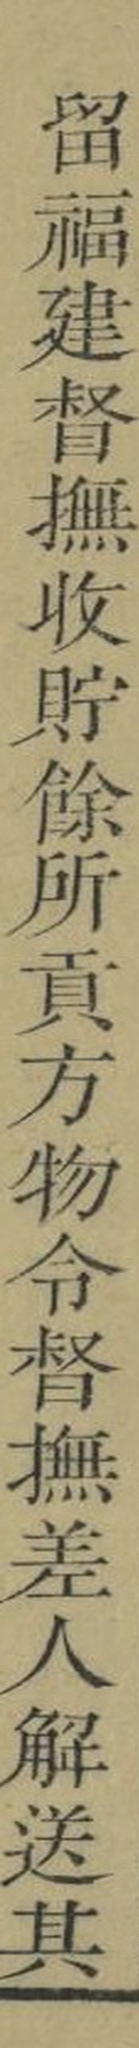留福建督撫収貯余所貢方物令督撫差人解送其
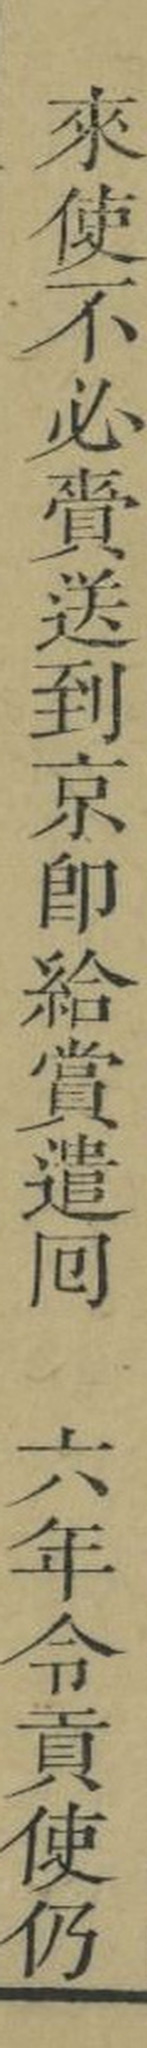来使不必賚送到京即給賞遣回六年令貢使仍
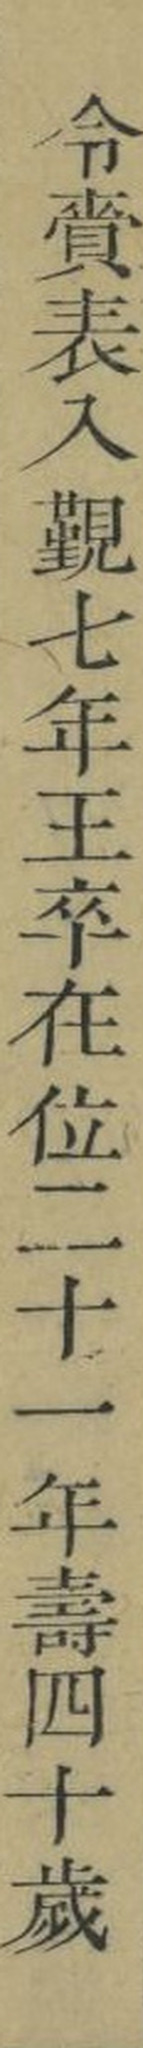令賚表入覲七年王卒在位二十一年寿四十歳
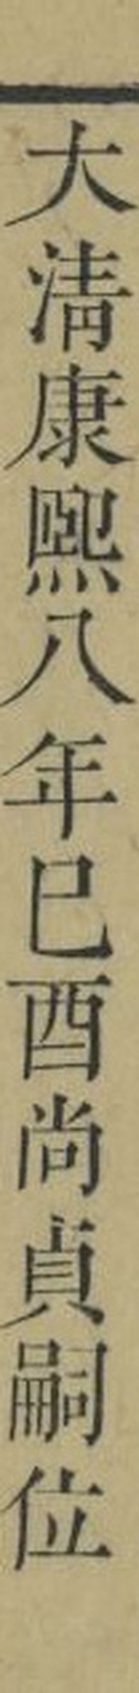大清康煕八年巳酉尚貞嗣位
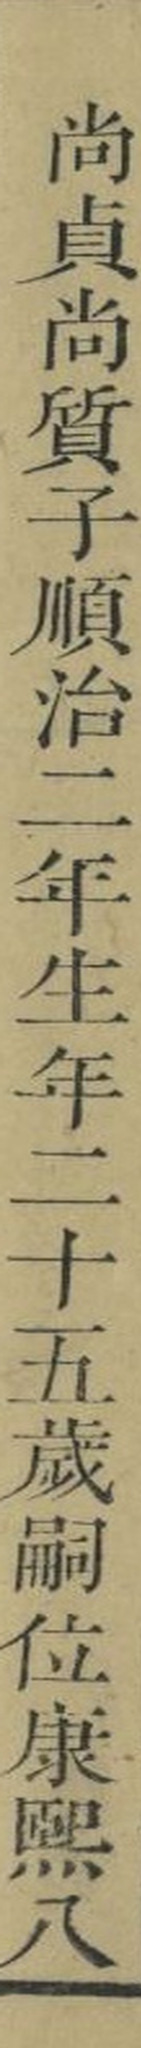尚貞尚質子順治二年生年二十五歳嗣位康煕八
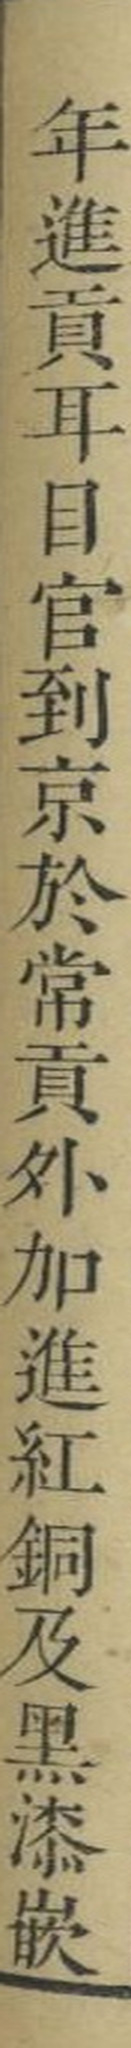年進貢耳目官到京於常貢外加進紅銅及黒漆嵌
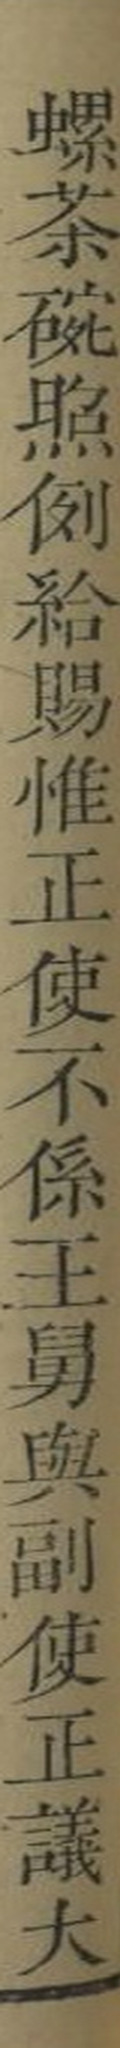螺茶碗照例給賜惟正使不係王舅与副使正議大
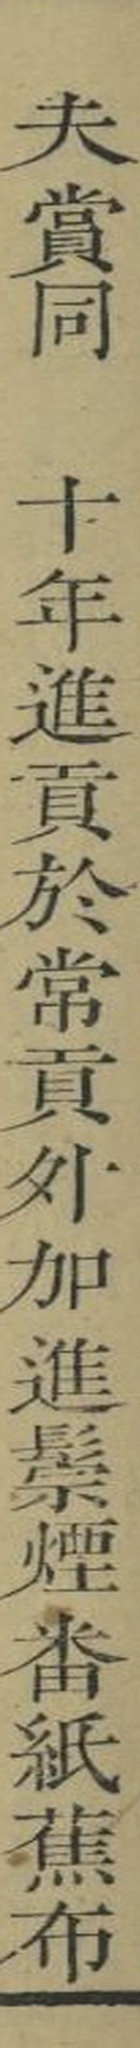夫賞同十年進貢於常貢外加進鬃煙番紙蕉布
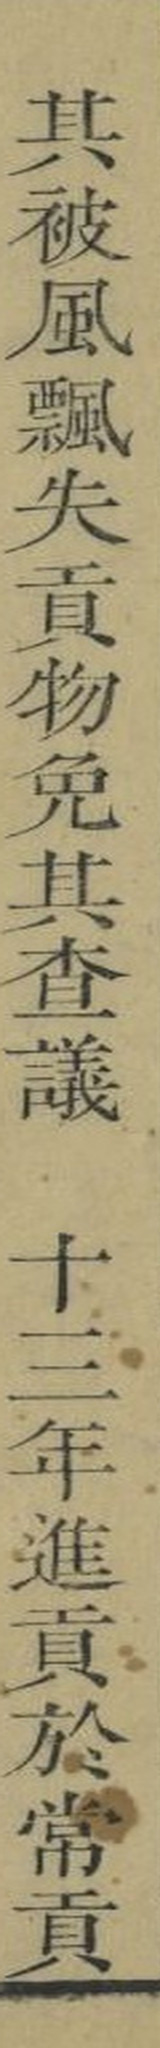其被風飄失貢物免其査議十三年進貢於常貢
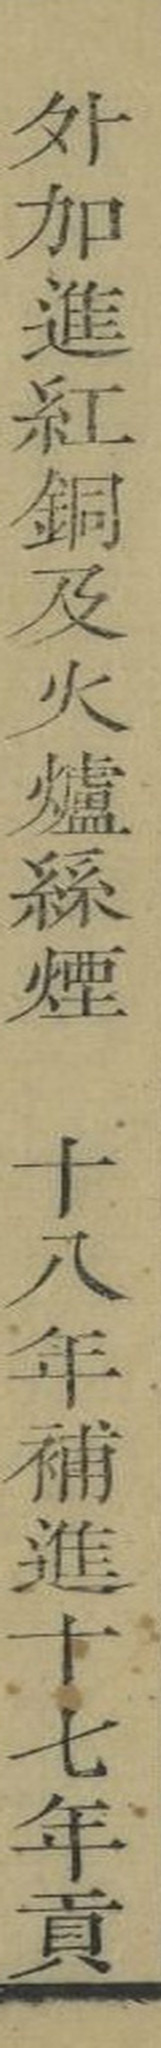外加進紅銅及火炉糸煙十八年補進十七年貢
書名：中山伝信録 巻三
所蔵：University of the Ryukyus Library
